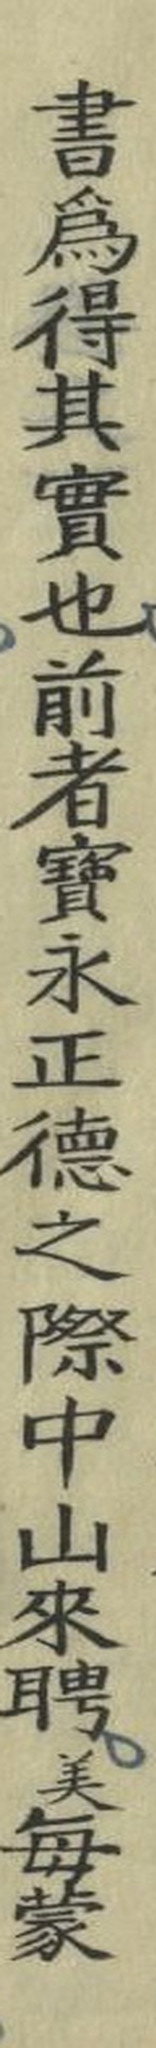書爲得其實也。前者寶永正德之際中山來聘。美每蒙
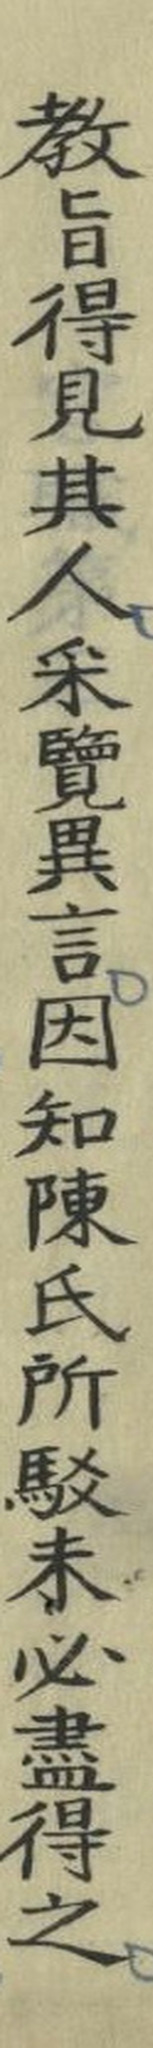教旨得見其人。釆覽異言。因知陳氏所駁未必盡得之。
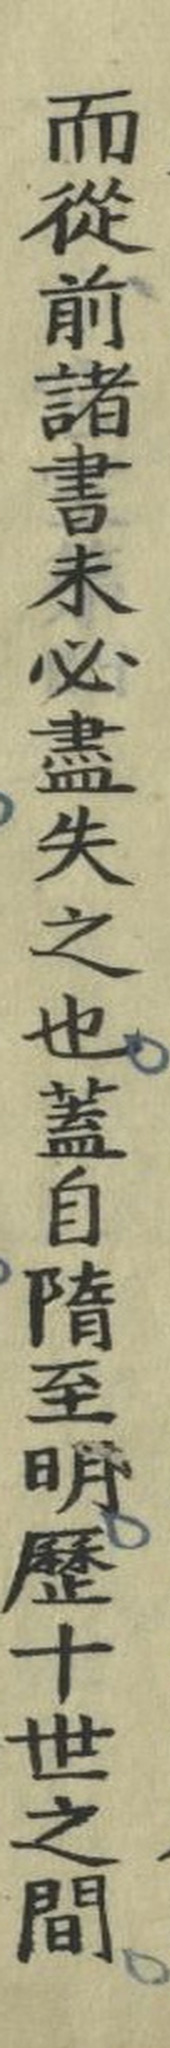而從前諸書未必盡失之也。蓋自隋至明。歷十世之間。
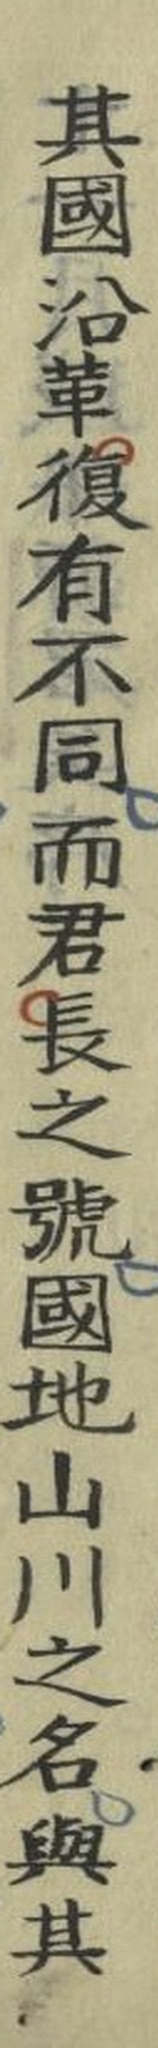其國沿革復有不同。而君長之號。國地山川之名。與其
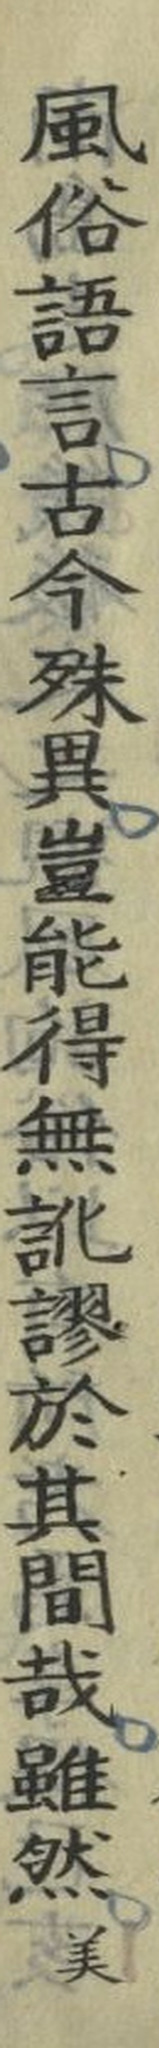風俗語言。古今殊異。豈能得無訛謬於其間哉。雖然。美
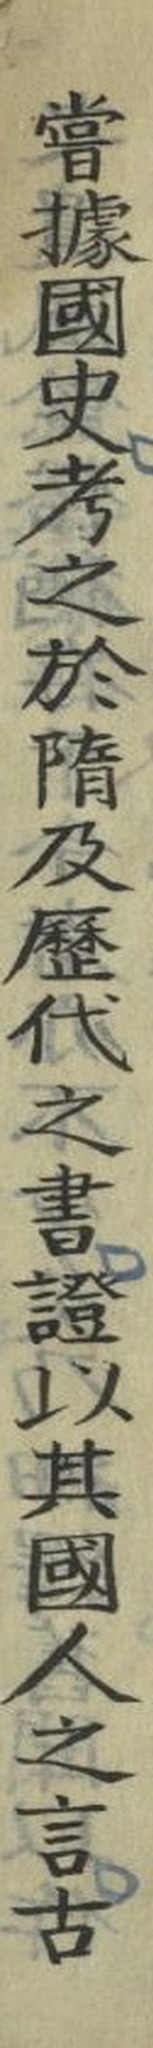嘗據國史。考之於隋及歷代之書。證以其國人之言。古

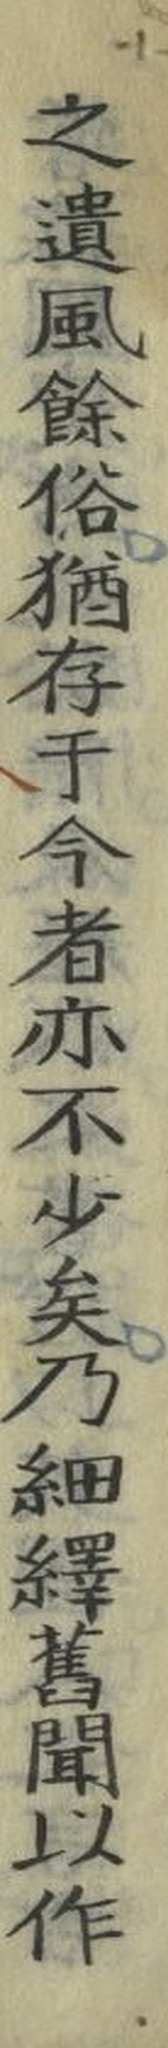之遺風餘俗。猶存于今者亦不少矣。乃細繹舊聞以作
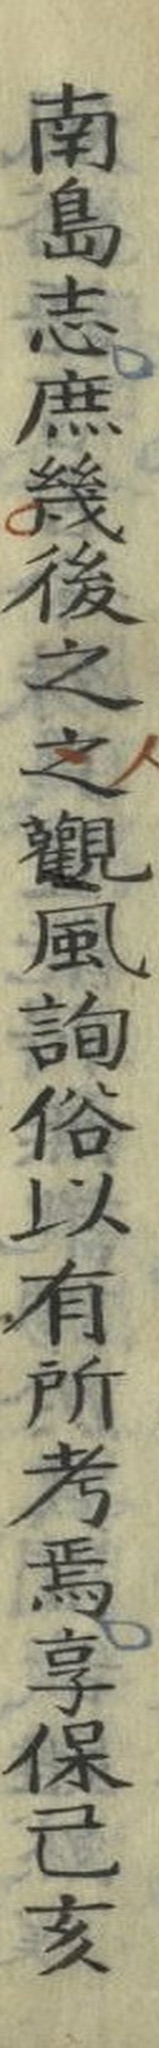南島志。庶幾後之人觀風詢俗以有所考焉。享保己亥
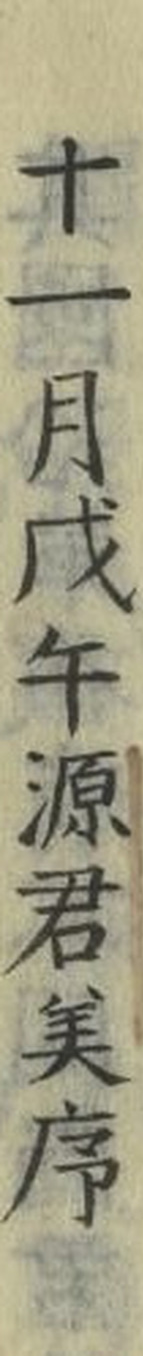十一月戊午源君美序
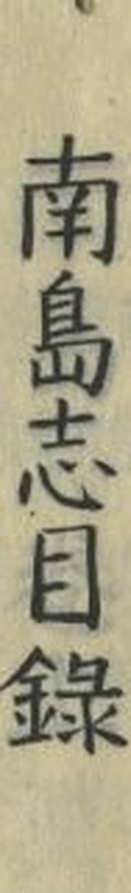南島志目録
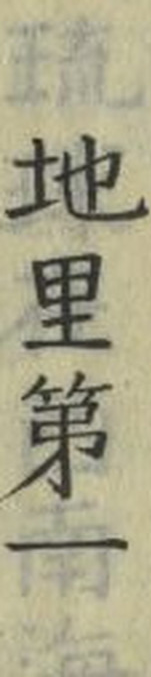地里第一
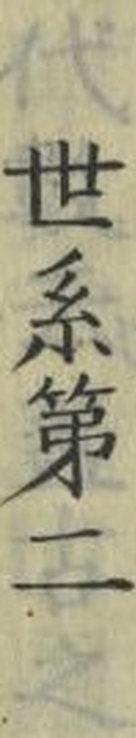世系第二
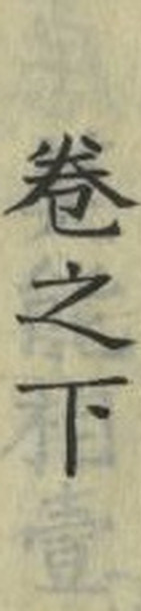卷之下
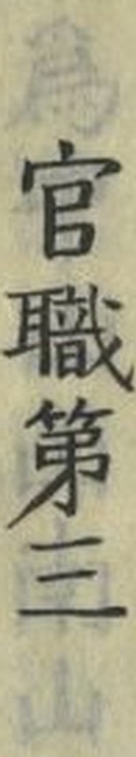官職第三
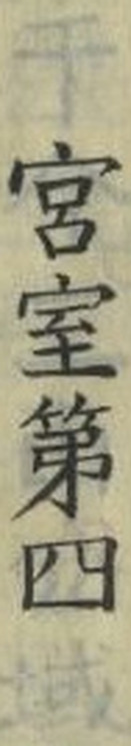宮室第四
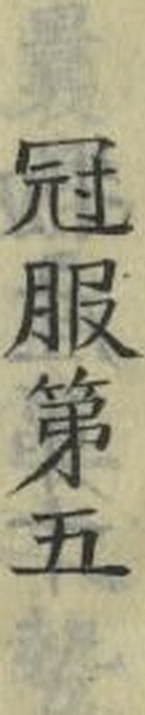冠服第五
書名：南島志
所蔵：University of the Ryukyus Library
